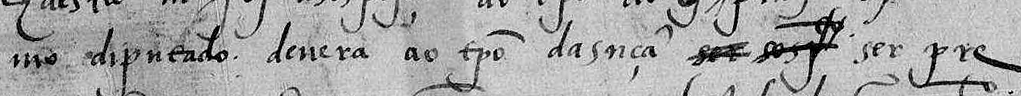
mo diputado. deuera ao tp̄o da snçā ser sospto ser pre
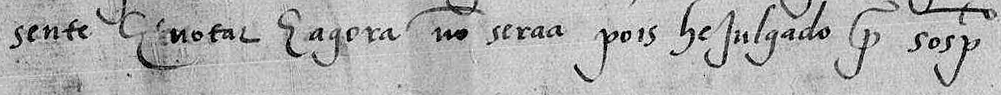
sente E uotar E agora n̄o seraa pois he Julgado p̄o sospto
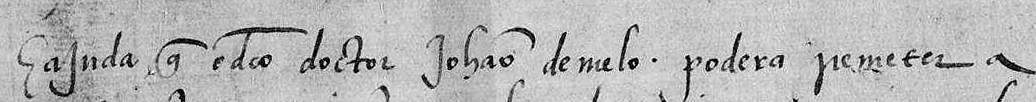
E aJnda q̄ o d̄co doctor Johão de melo. podera remeter a
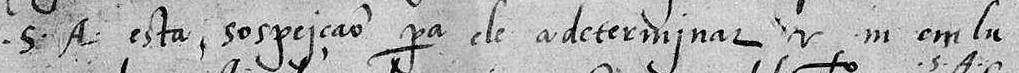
.S. A. esta sospejçaõ ꝑa ele a determjnar v .m em lu
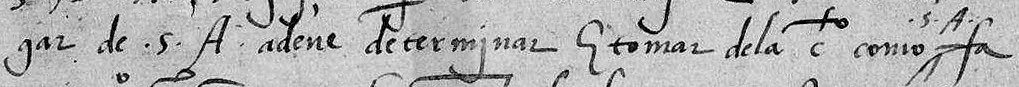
gar de .s. A. a deue determjnar E tomar dela cto como .s. A. fa
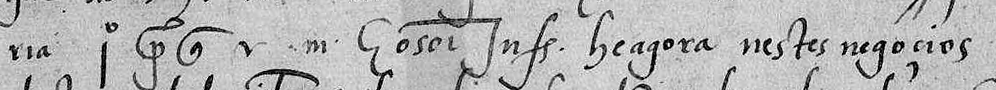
ria 1o p̄oq̄ v .m. E o s̄or Jnfꝭ. he agora nestes negocios
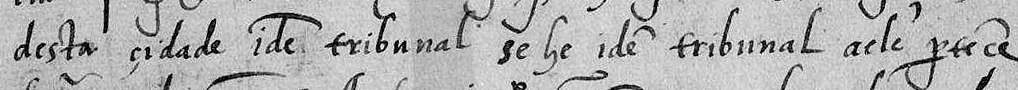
desta cidade īde tribunal se he idē tribunal a ele ꝑtēce
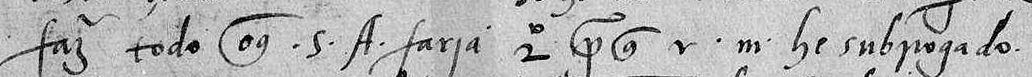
faz̄ todo o q̄ .s. A. farja 2o p̄oq̄ v. m. he subrogado
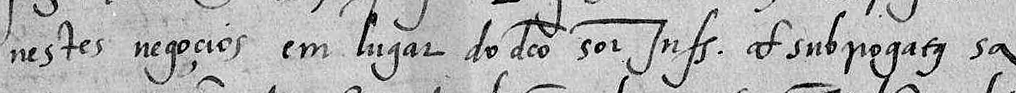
nestes negocios em lugar do d̄co s̄or Jnfꝭ. al̄ subrogatꝯ sa
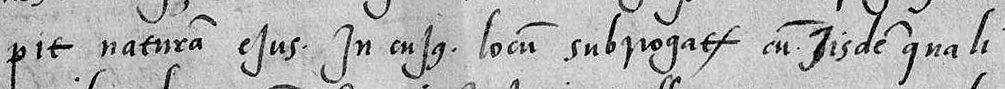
pit naturā eJus. Jn cuJꝯ. locū subrogaꝷ cū Jisdē quali
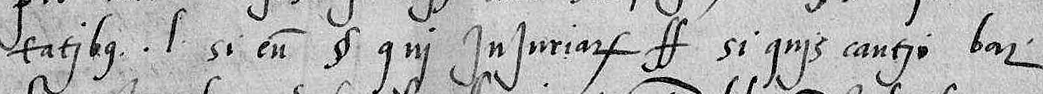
tatjbꝯ. l si eū § quj JnJuriaꝝ .ff siqujs cautjo bar
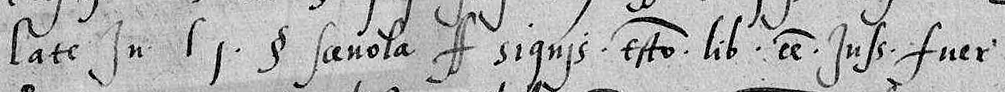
late Jn l. 1 § Sceuola ff siqujs. t̄sto. lib. ēe. Juss. fuer
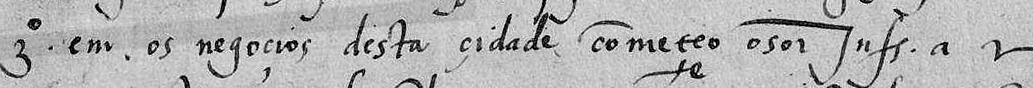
3o. em. os negocios desta cidade c̄ometeo o sōr Jnfꝭ. a v
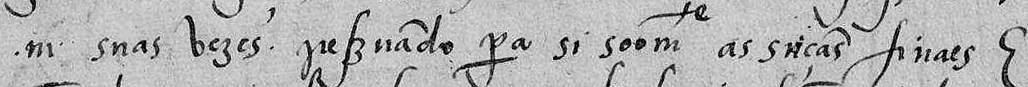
.m. suas vezes reꞩuādo ꝑa si soomte as snçās finaes E
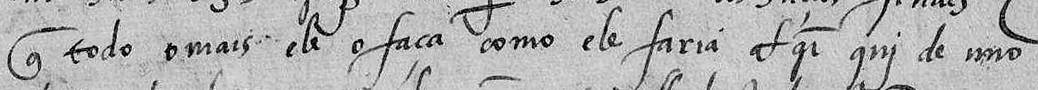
q̄ todo o mais ele o faça como ele faria al̄q̄i quj de uno
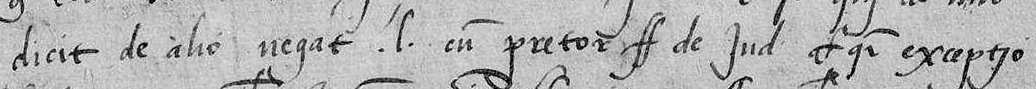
dicit de alio negat .l. cū pretor ff de Jud al̄qī exceptjo
